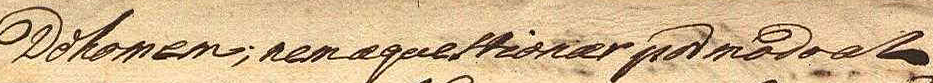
Do homem; nem a questionar por modo al
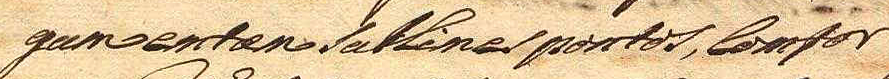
gum em tam subLimes pontos, Comfor
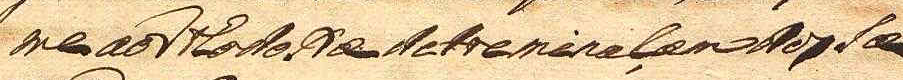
me a orthodoxa detreminaÇam dos sa
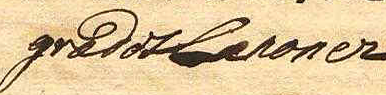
grados Canones
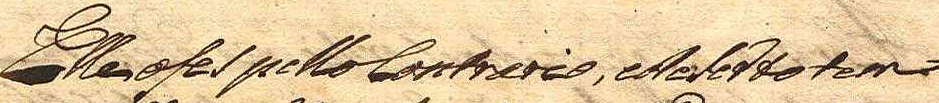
Elle o fes pello Contrario, e de serto tem
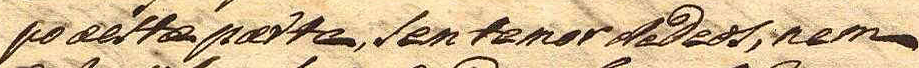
po a esta parte, sem temor de Deos, nem
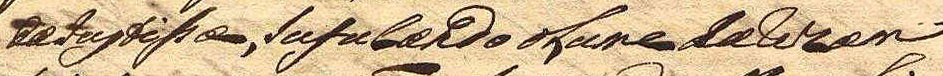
da Iustissa, sufuCando o Lume da Rezam
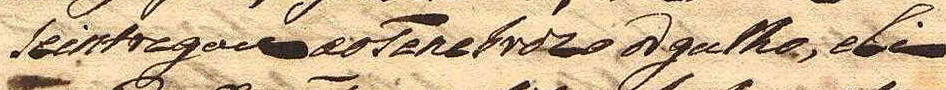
se intregou ao Tenebrozo orgulho, e li
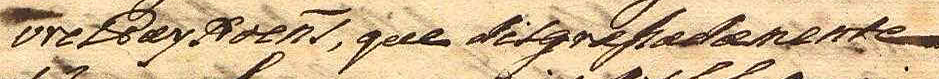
vre Payxoen̄s, que disgrassadamente
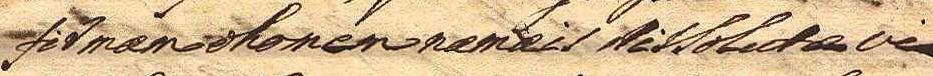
firmam o homem na mais dissoLuta vi
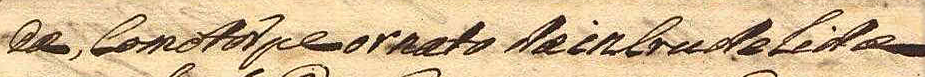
da, Com o torpe ornato da inCrudeLida
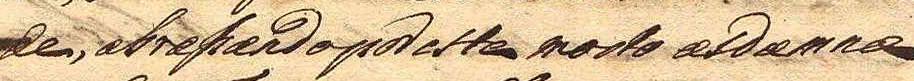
de, abrassando por este modo as damna
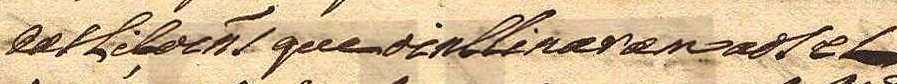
das LiÇoeñs que o inclinaram aos es
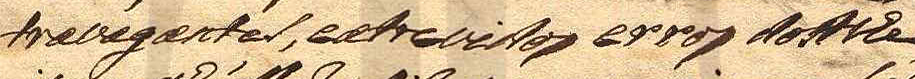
travagantes, e atrevidos erros do athe
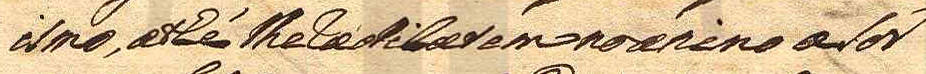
ismo, athé lhe RadiCarem no animo a sor
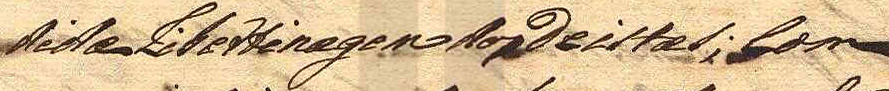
dida Libertinagem dos deistas; Com
